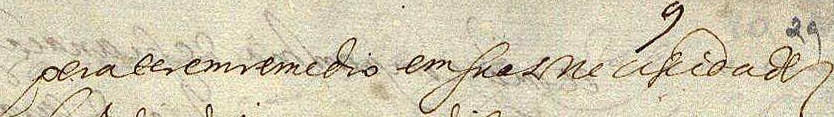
pera terem remedio em suas necessidadez
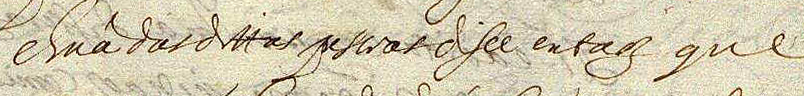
e huā das dittas pessoas disse entaõ que
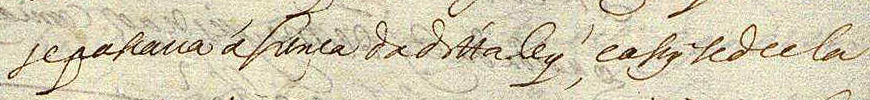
se passaua á Crença da ditta ley, e assy se decla
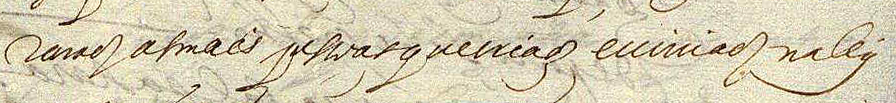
raraõ as mais pessoas que criaõ e uiuiaõ na ley
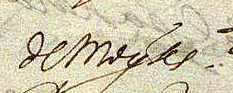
de moyses?
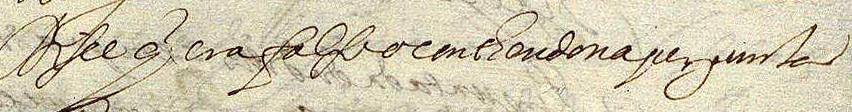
Disse q̄ era falso o contheudo na pergunta
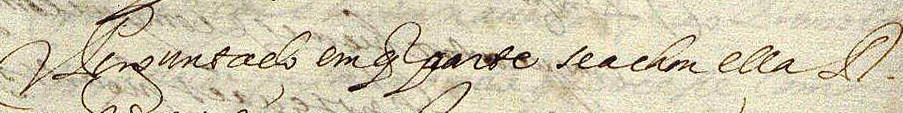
Perguntado em q̄ parte se achou ella R.
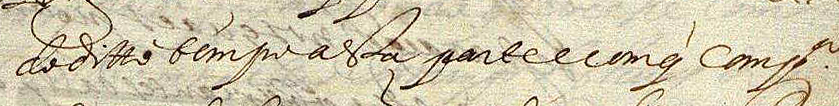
do ditto tempo a esta parte e com q̄ compa.
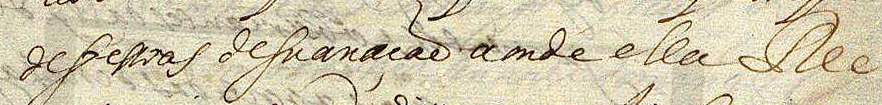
de pessoas de sua naçaõ aonde ella Ree
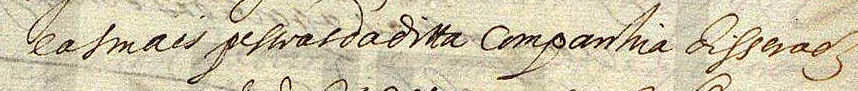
e as mais pessoas da ditta companhia disseraõ
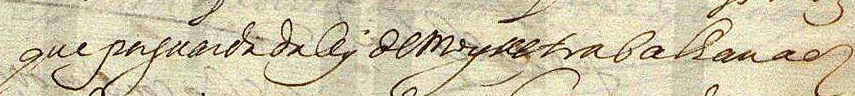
que por guarda da ley de moyses trabalhauaõ
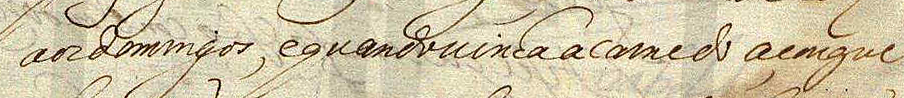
aos domingos, e quando uinha a carne do açougue
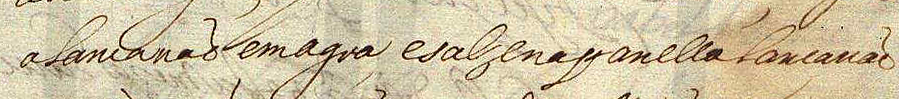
a lançauaõ em agoa e sal e na panella lançauaõ
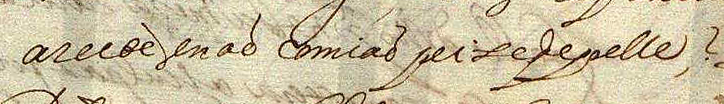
azeite e naõ comião peixe de pelle?
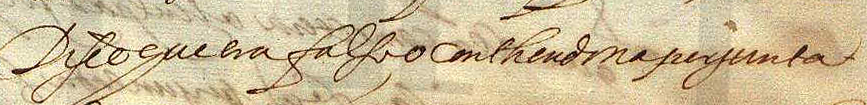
Disse que era falso o contheudo na pergunta
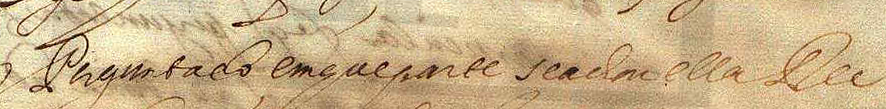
Perguntado em que parte se achou ella Ree
